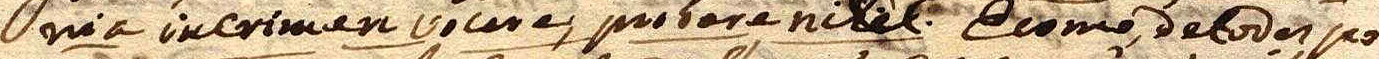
nia incrimen vocare; probare nihil. E como, de todos po
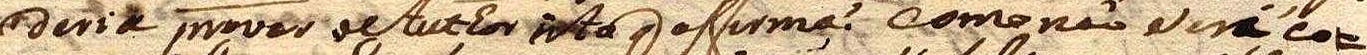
deria provar o Author isto q̄ affirma? como não será co
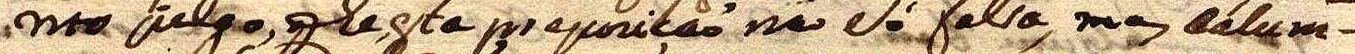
nto julgo q̄ he esta prepoziçaõ não só falsa, mas Cálum
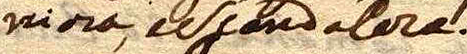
nioza, e scandaloza?
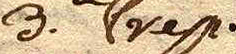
3.a Prep.
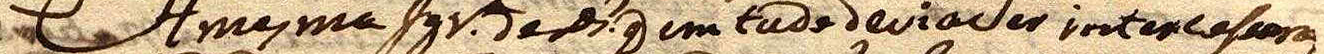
A mesma Jgr.a de Ds̄? q̄ em tudo devia ser intercessora
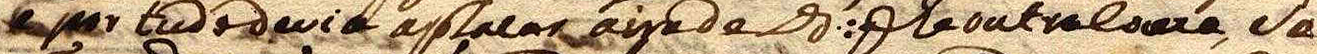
e por tudo devia aplacar a iyra de Ds̄?: q̄ he outra Couza, se
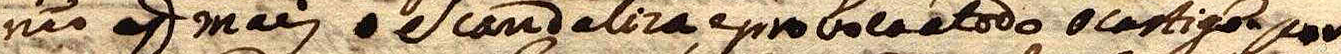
não a q̄ mais o escandaliza, e provoca a todo o castigo? por
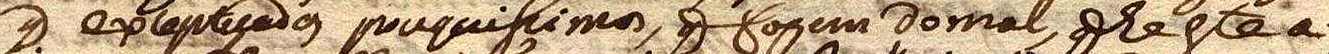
D. exceptuados pouquissimos, q̄ fogem do mal, q̄ he este a
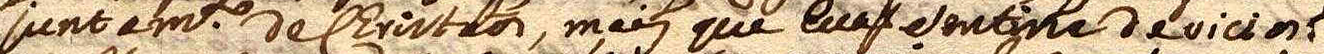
juntam.to de Christaõs, mais que huā sentina de vicios?
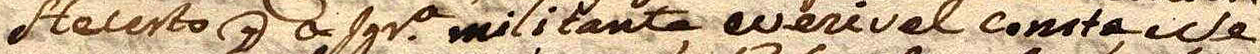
Sta certo q̄ a Jgr.a militante e vezivel consta, e se
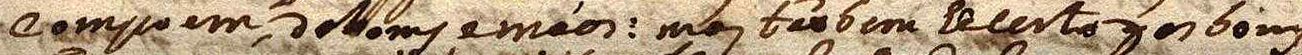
compoem, de boms e máos: más tãobem he certo q̄ os bons
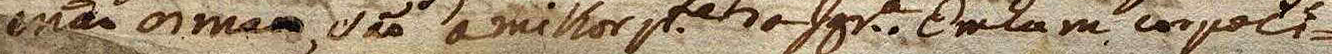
e não os máos, são a milhor p.te da Jgr.a Em hum corpo ci
